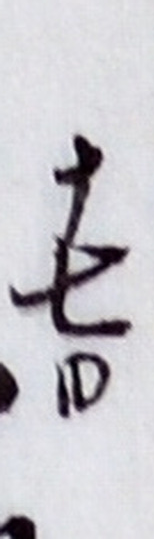十七日
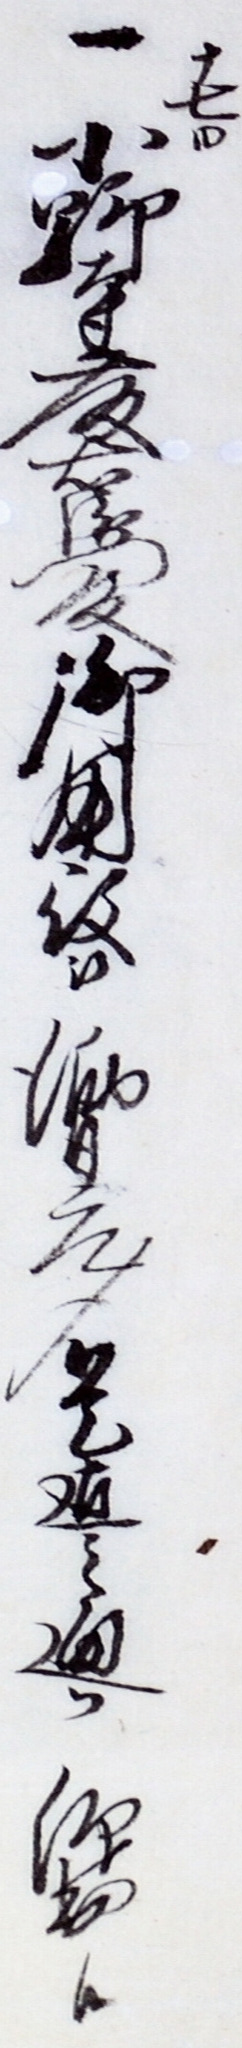一小野寺藤右衛門殿御用役被仰付元〆是迄之通被仰出候
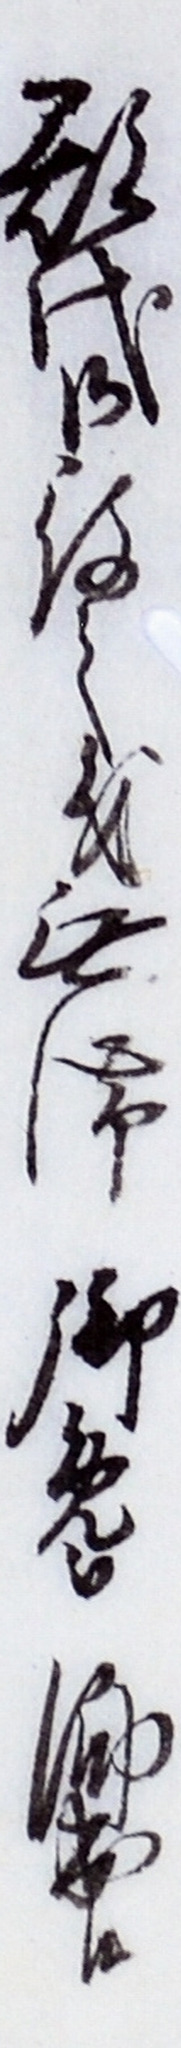郡代御役之義無滞御免被仰出候
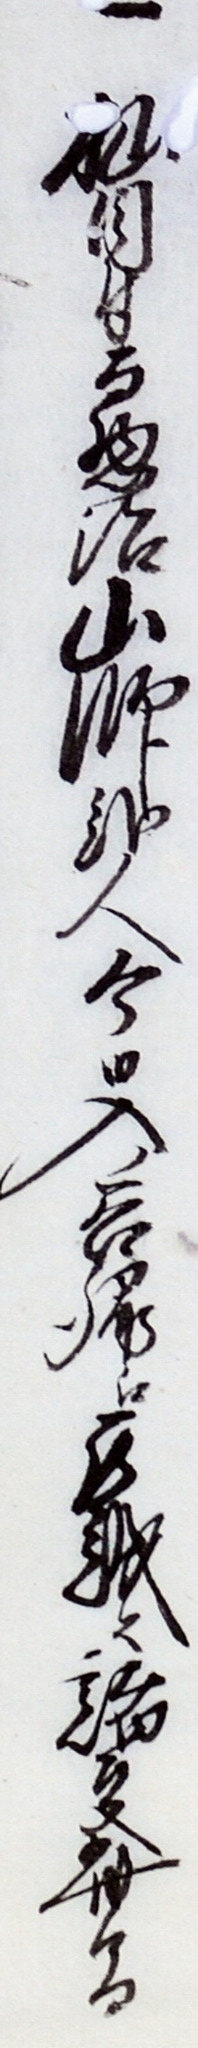一杣目付与惣治山師弐人今日入ノ谷郷江罷越ス諸事此間
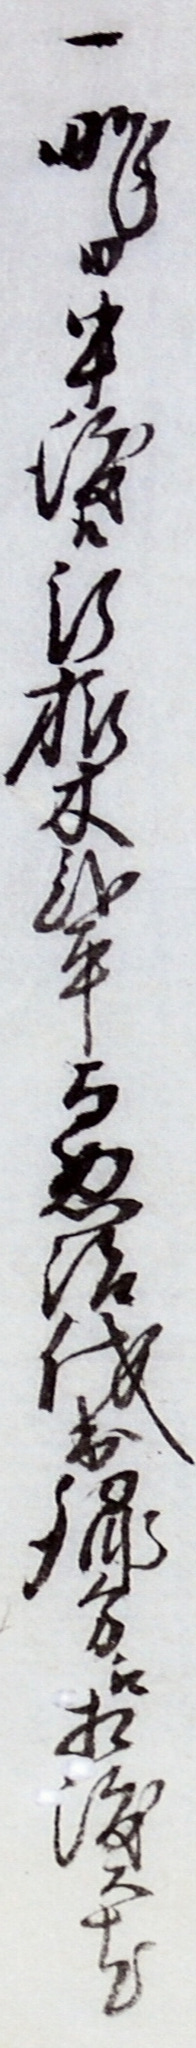一昨日中渡候行桁木弐本与惣治伐出郷方江相渡ス尤
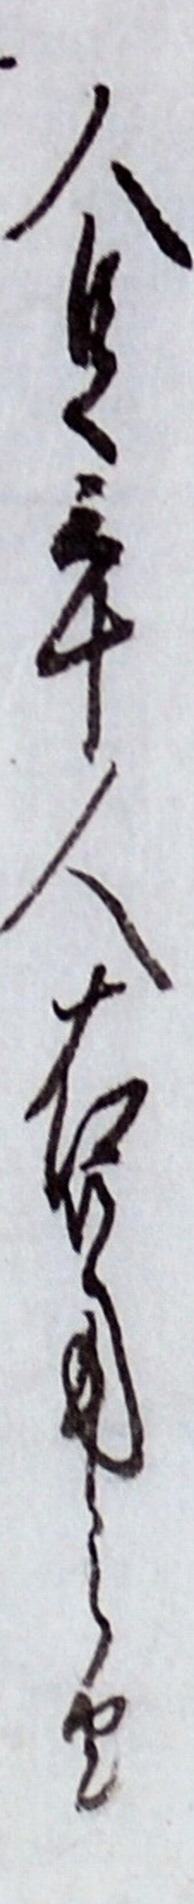人足三十人右御用之由
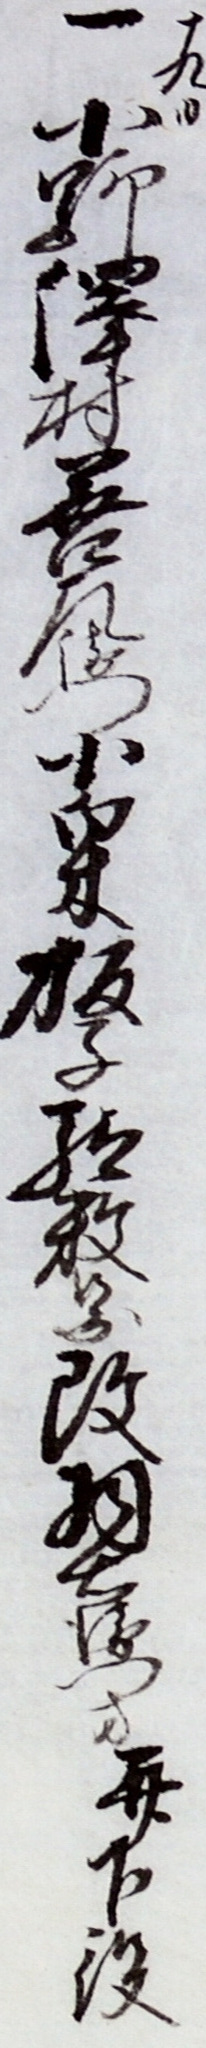一小野沢村善左衛門小白木板子駄数図改羽右衛門方并下役
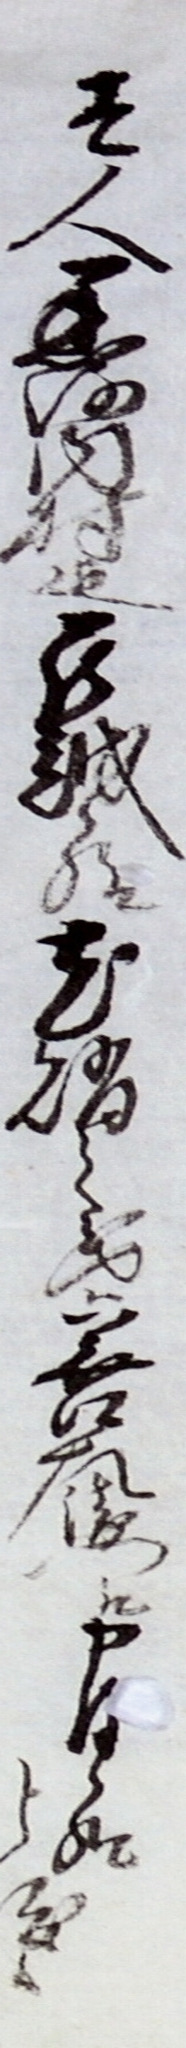壱人黒河内村迄罷越候様尤賄之義ハ善左衛門江申付候様申渡候
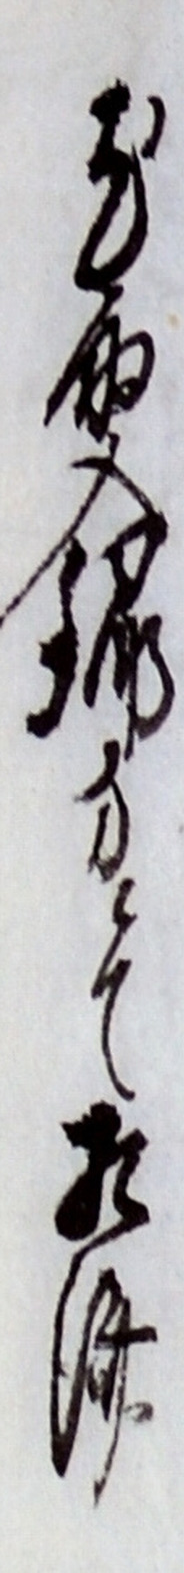尤取〆郷方ニて相済

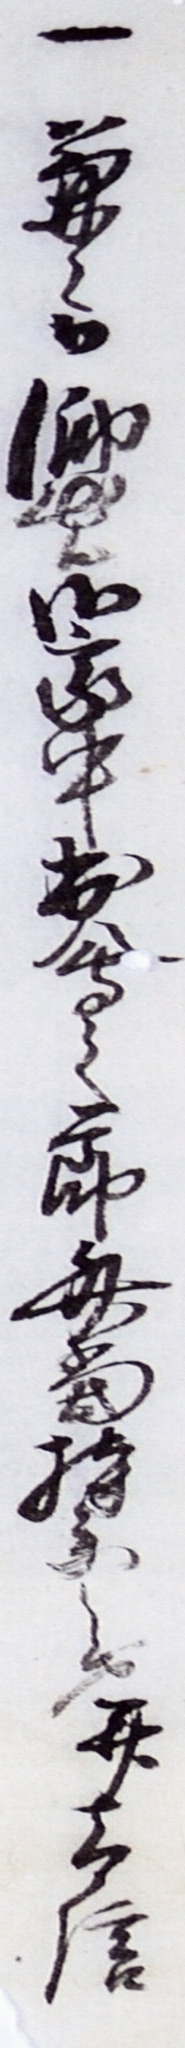一兼々被仰出候御家中出会之節弁当持参之義并知信
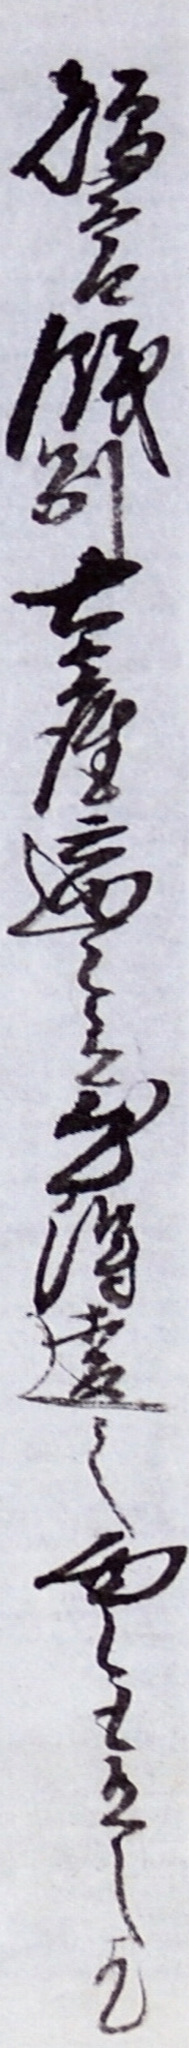贈答餞別土産適之心得違之面々も有之申候
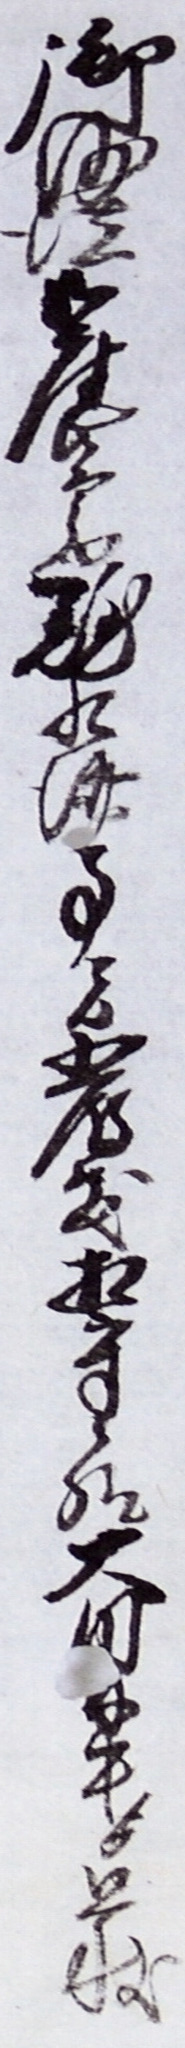御沙汰御座候而は難相済事ニ而厳敷相守候様大目付中ゟ廻状
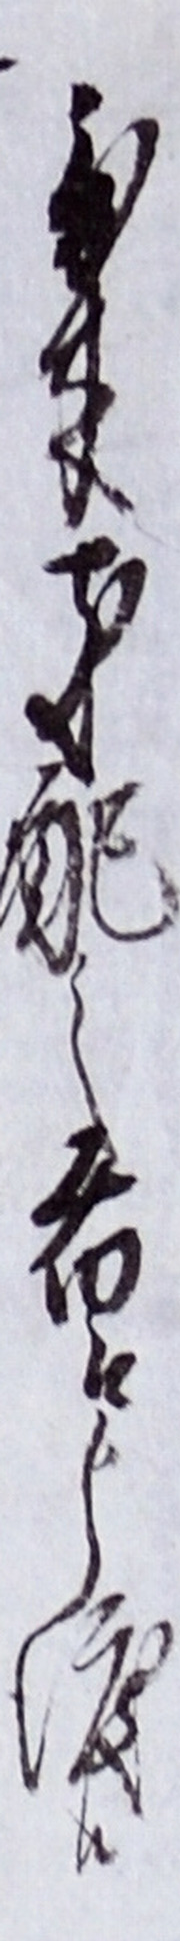到来手配之者江申渡候
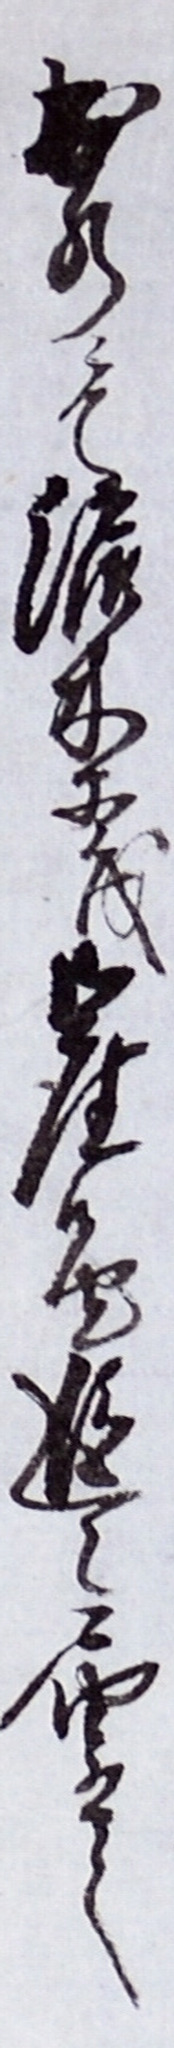出水ニて流木等も御座候由段々届有之
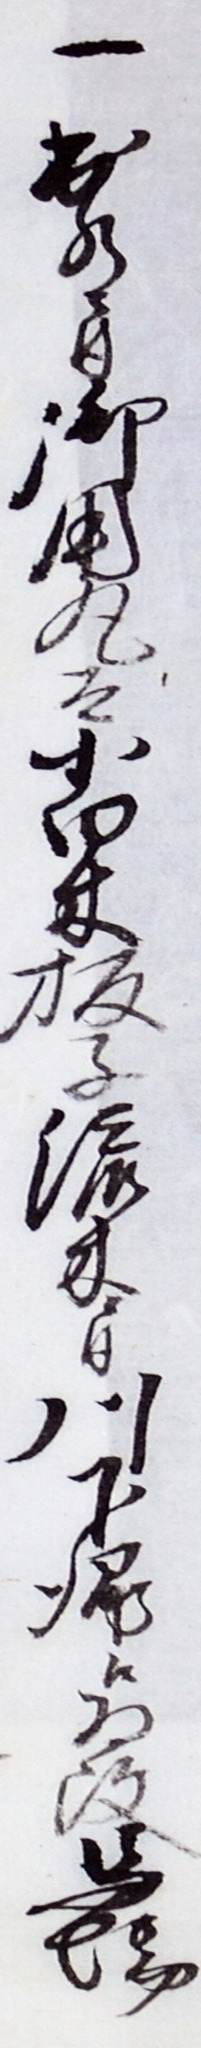一出水ニ付御用丸太小白木板子流木ニ付川下郷江為改馬場
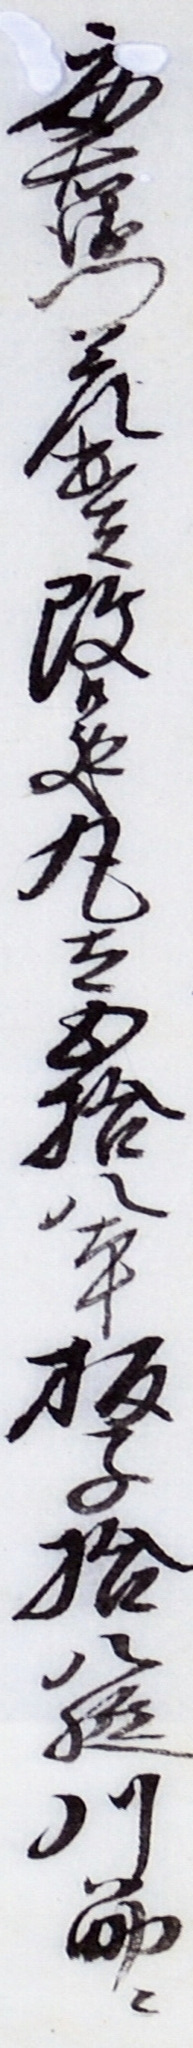安右衛門差遣候改候処丸太五拾八本板子拾八挺川筋ニ
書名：御山奉行御用控
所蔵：伊那市立高遠町図書館・合同会社AMANE
